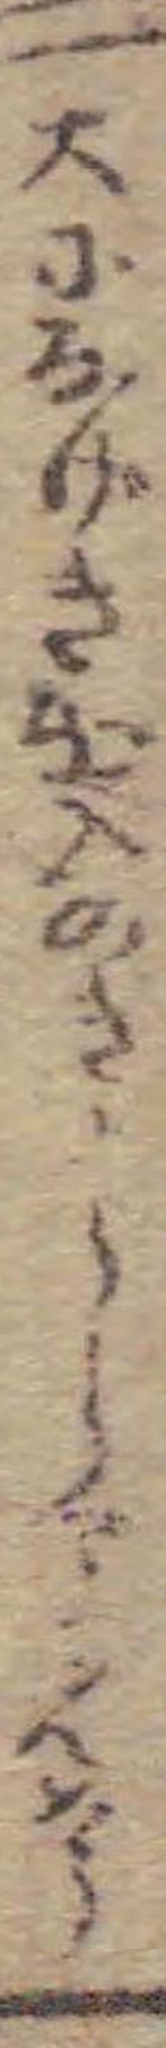大になげき出入のきとうしやんめう
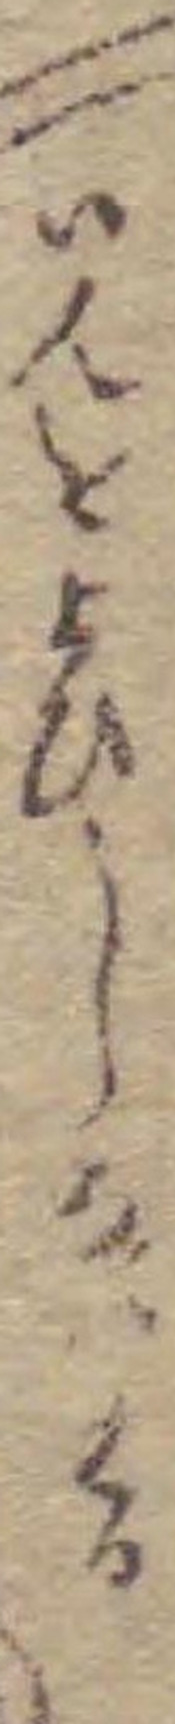いんをよひうらなはさる
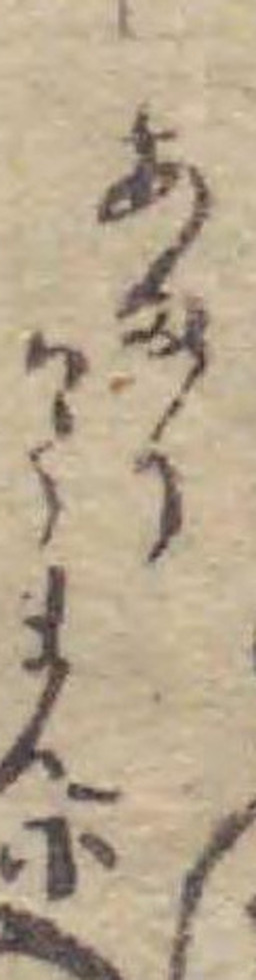かうまんに
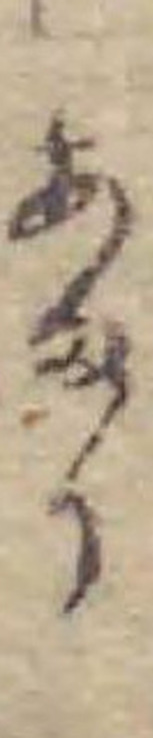あまり
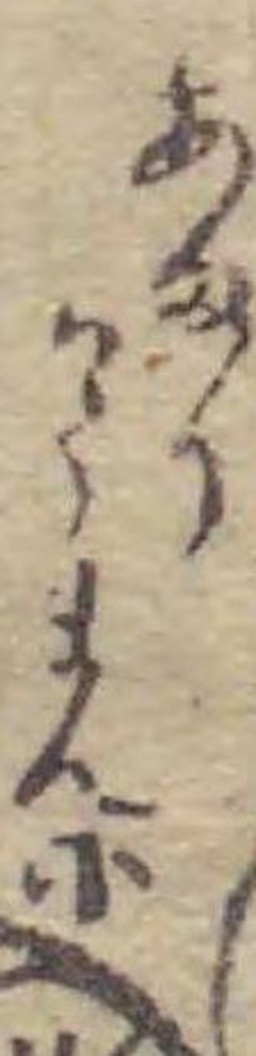かうまんに
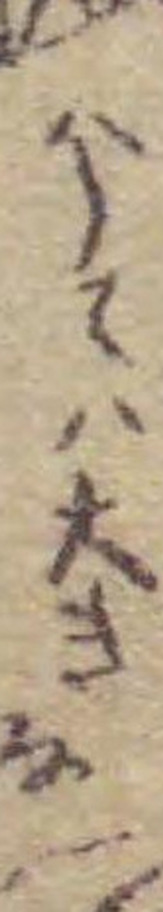今ては大きな
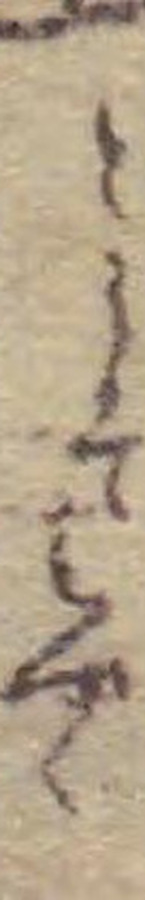とこかてはやく
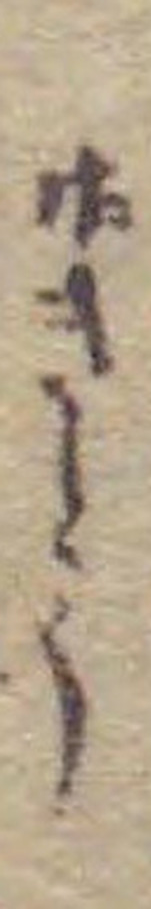御きとう
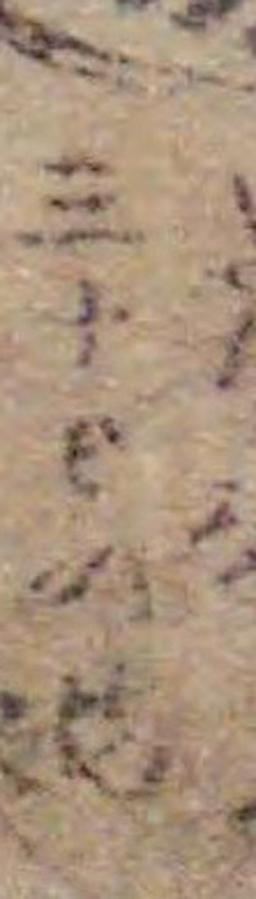三十日の内
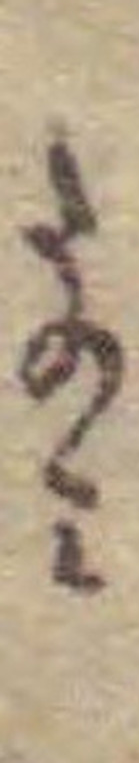たのみ
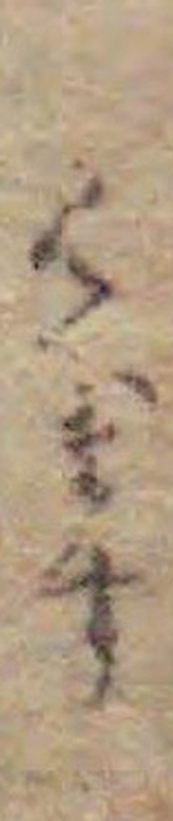見へます

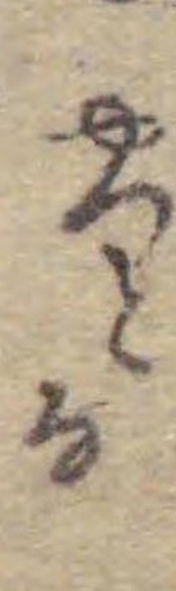やつとな
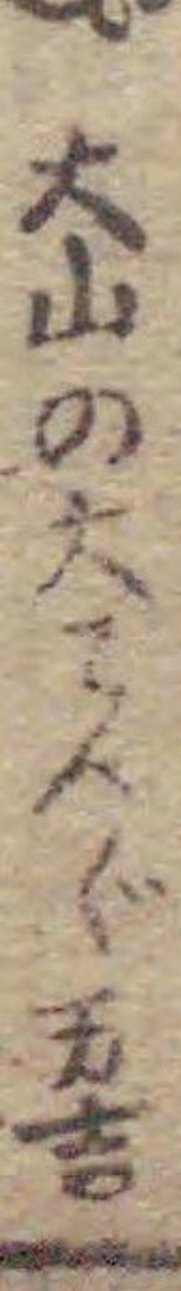大山の大てんぐ万吉
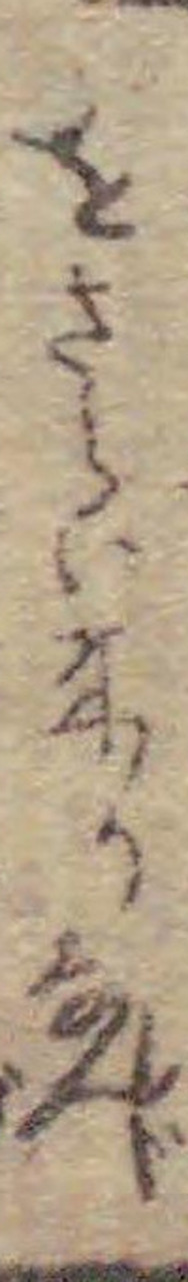をさらい来りなんじ
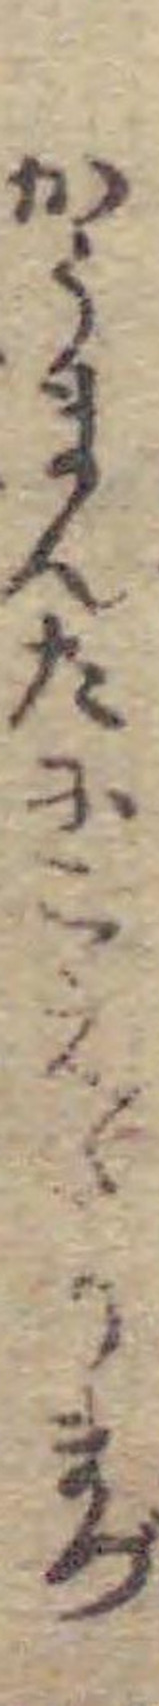かうまんたにこえたりまづ
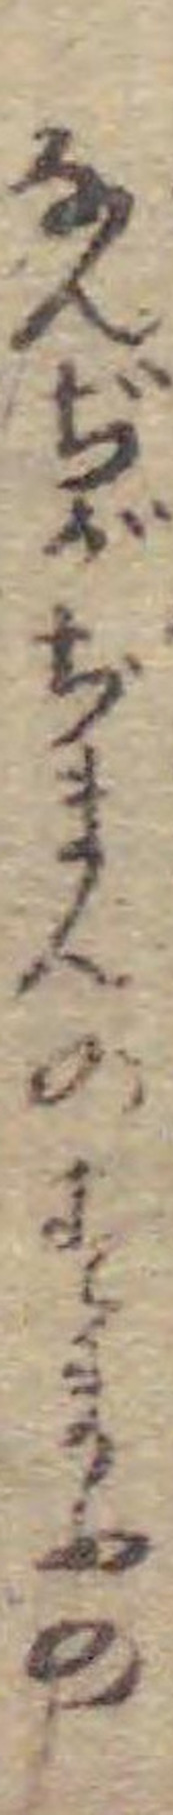なんぢがぢまんのすまふの
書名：鼻峰高慢男 : 2巻
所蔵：国立国会図書館 National Diet Library, JAPAN
